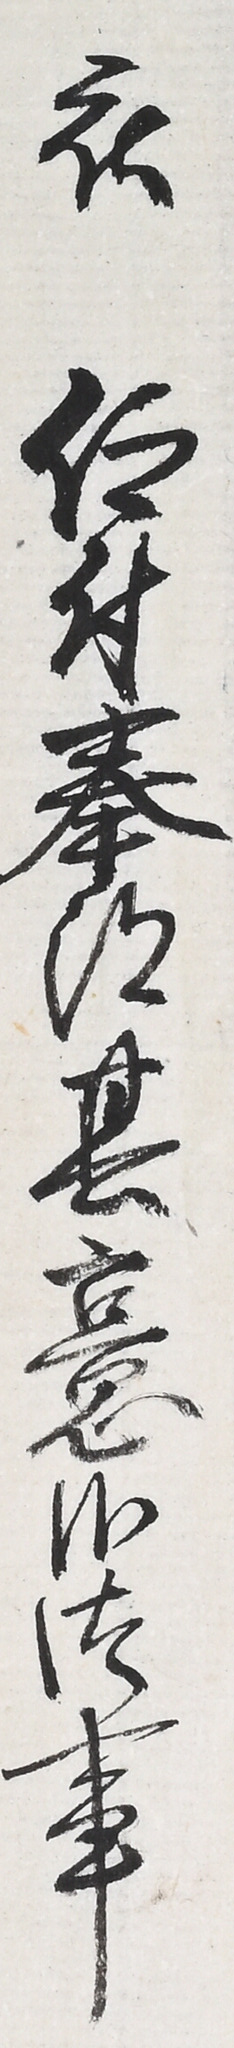被仰付奉得其意候御事
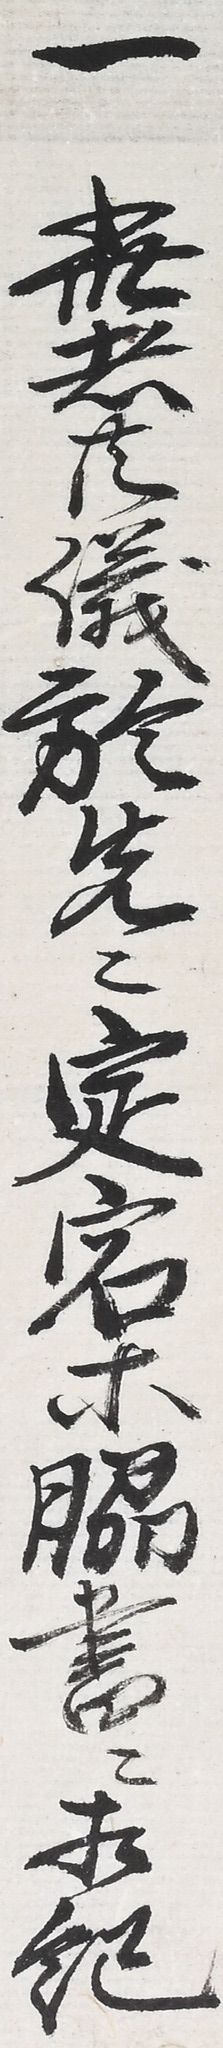一此者共儀於先々定宿等脇書ニ相記
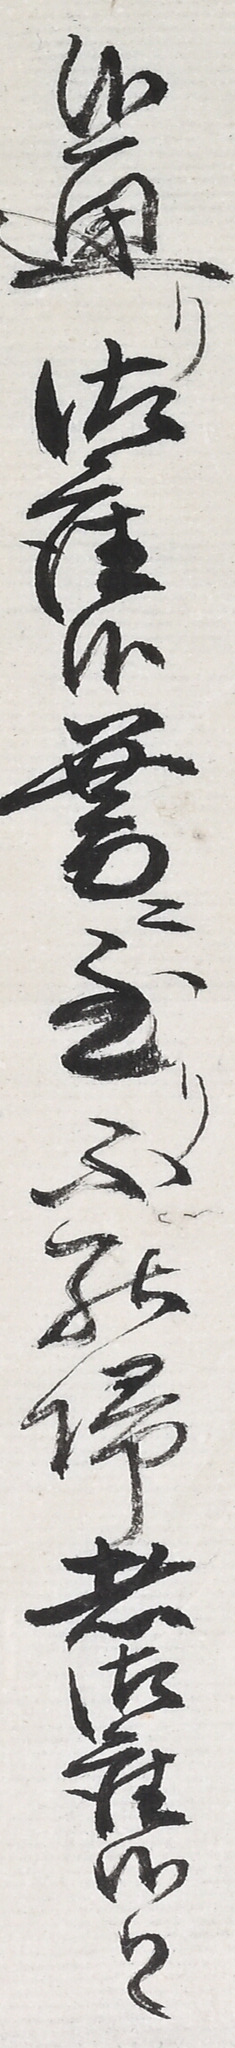候通リ御座候暮ニ至リ不罷帰者御座候ハヽ
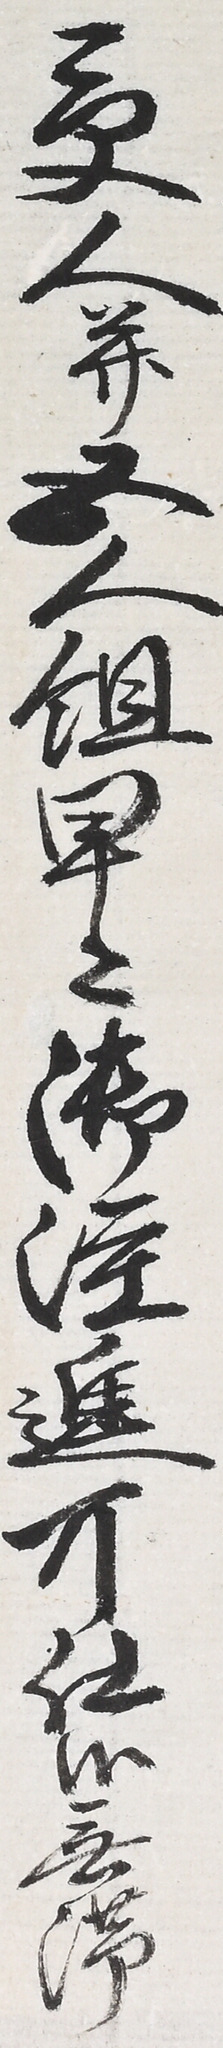受人并五人組早々御注進可仕候無滞
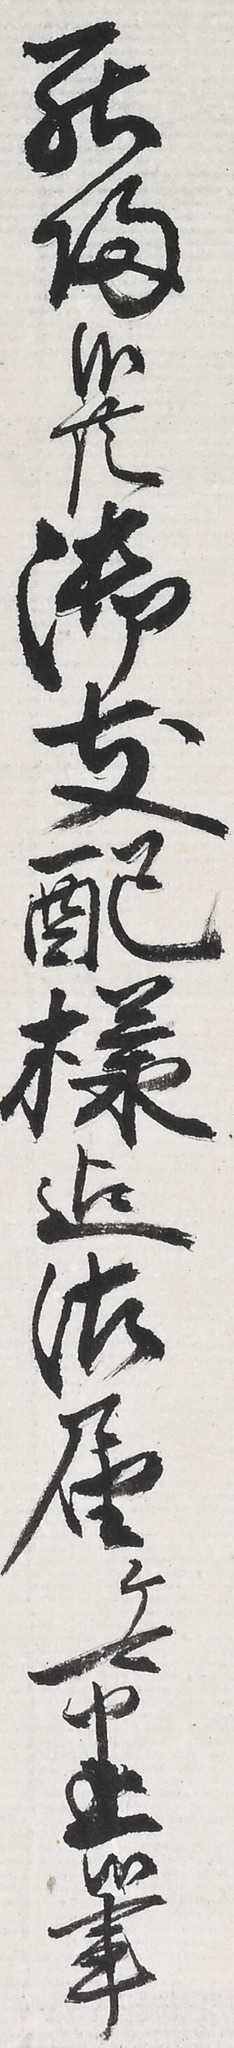罷帰候共御支配様迄御届ヶ可申上候事
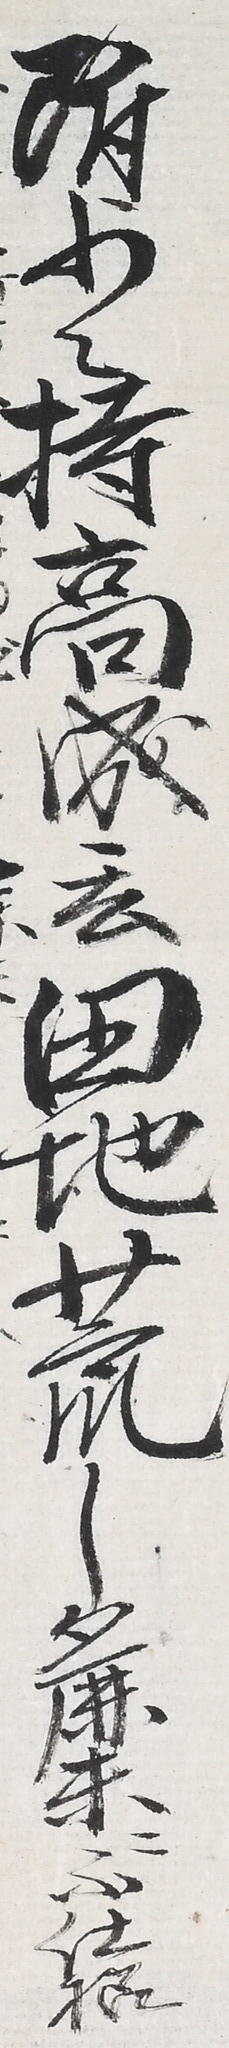附少々持高成共田地荒し粗末ニ不仕様
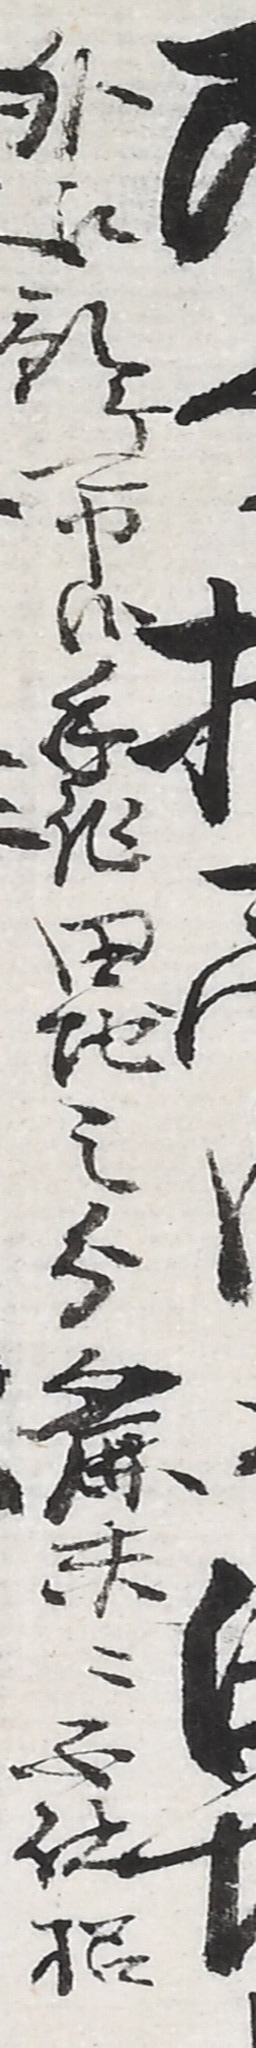外江預ヶ可申候手作田地之分粗末ニ不仕様
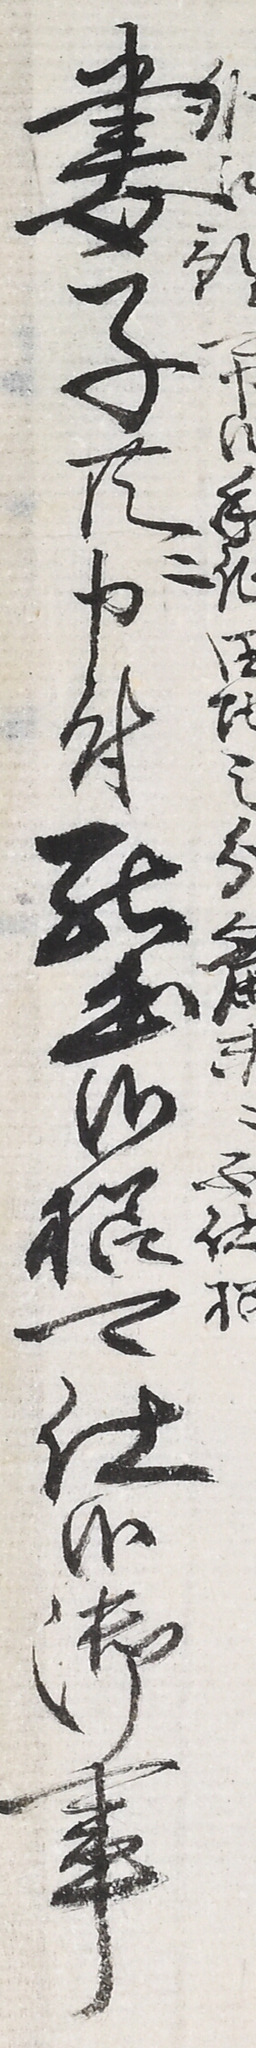妻子共ニ申付罷出候様可仕候御事

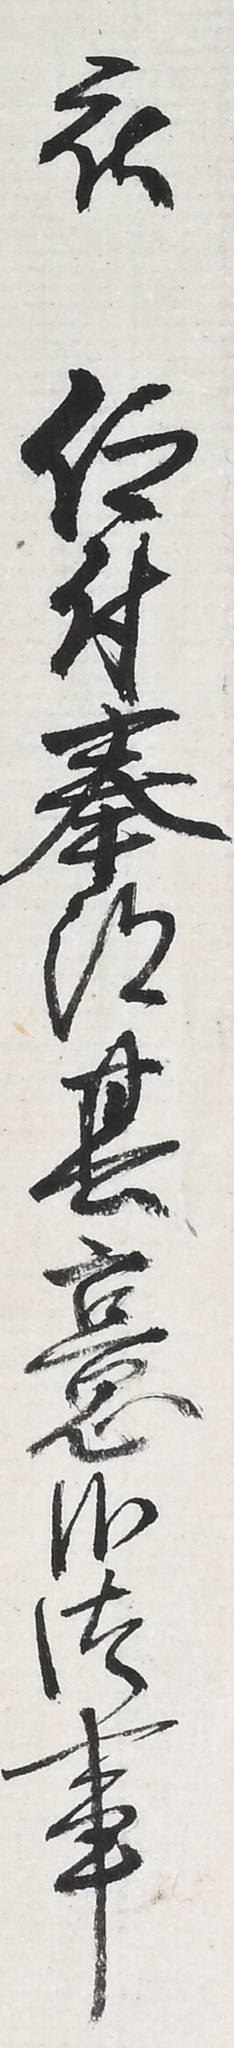被仰付奉得其意候御事
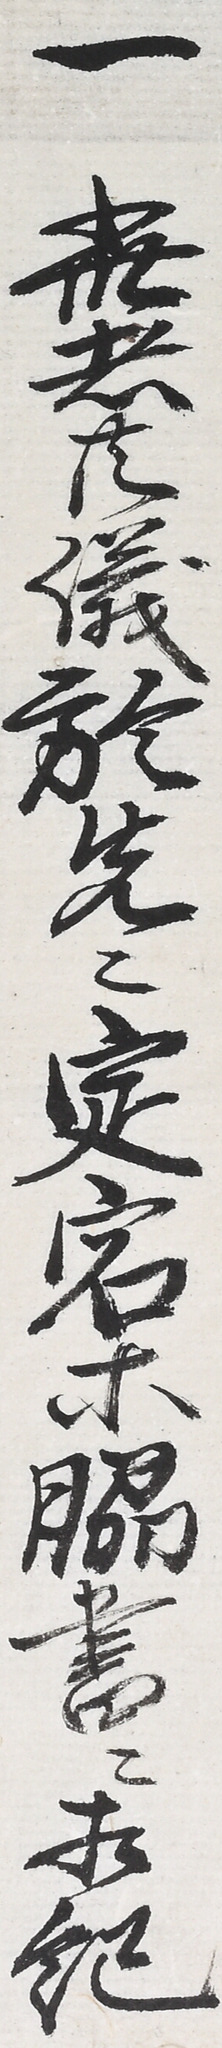一此者共儀於先々定宿等脇書ニ相記
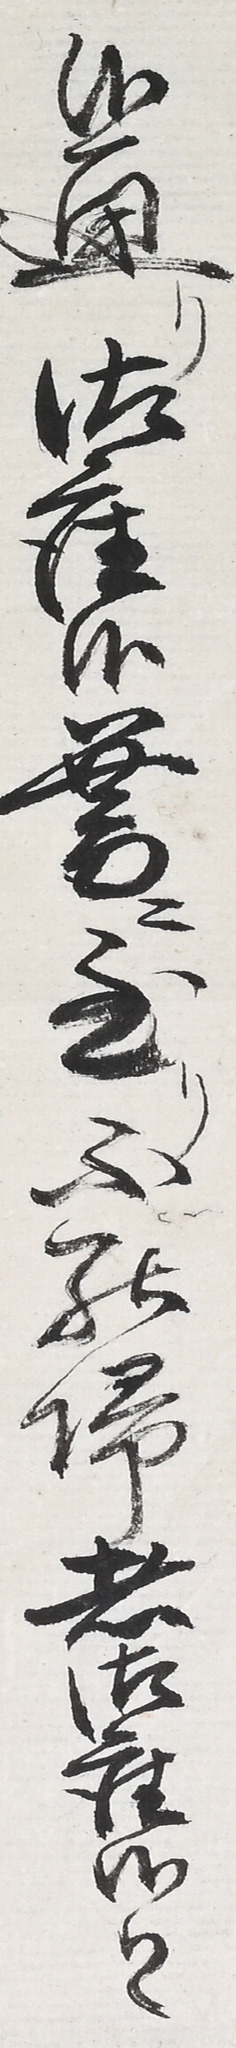候通リ御座候暮ニ至リ不罷帰者御座候ハヽ
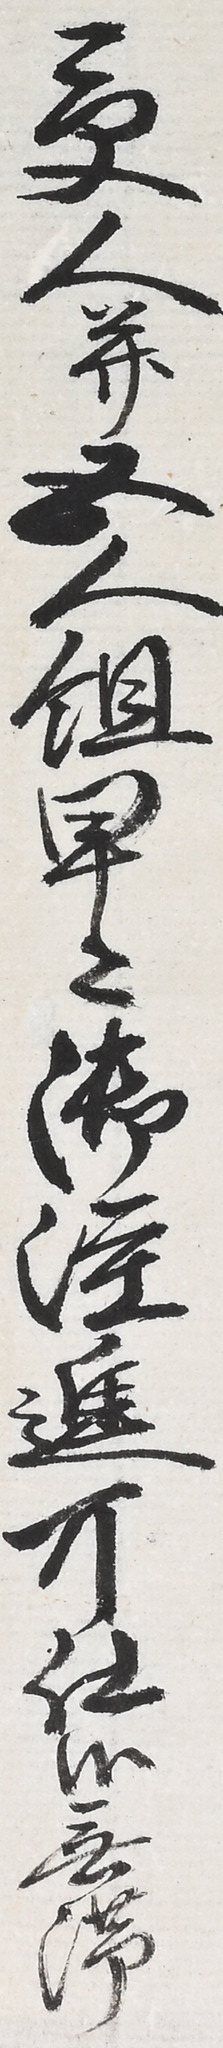受人并五人組早々御注進可仕候無滞
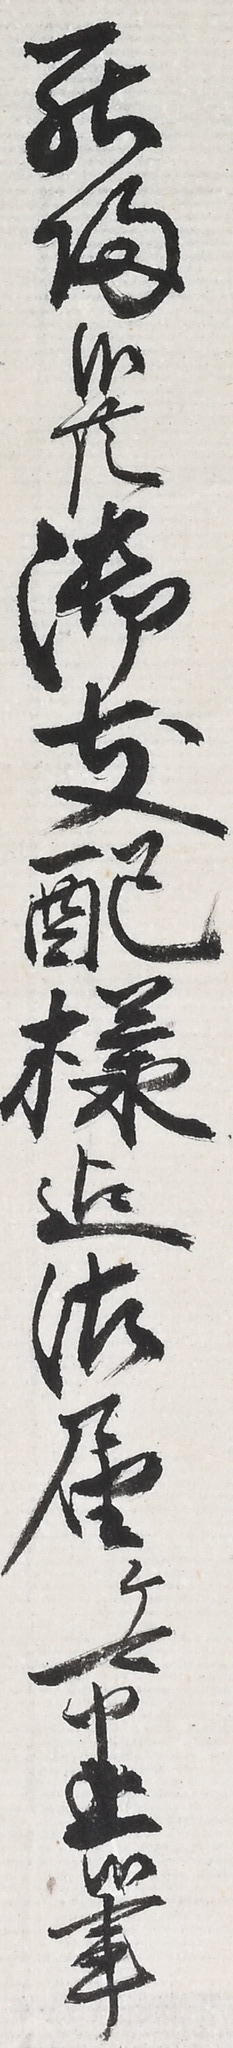罷帰候共御支配様迄御届ヶ可申上候事
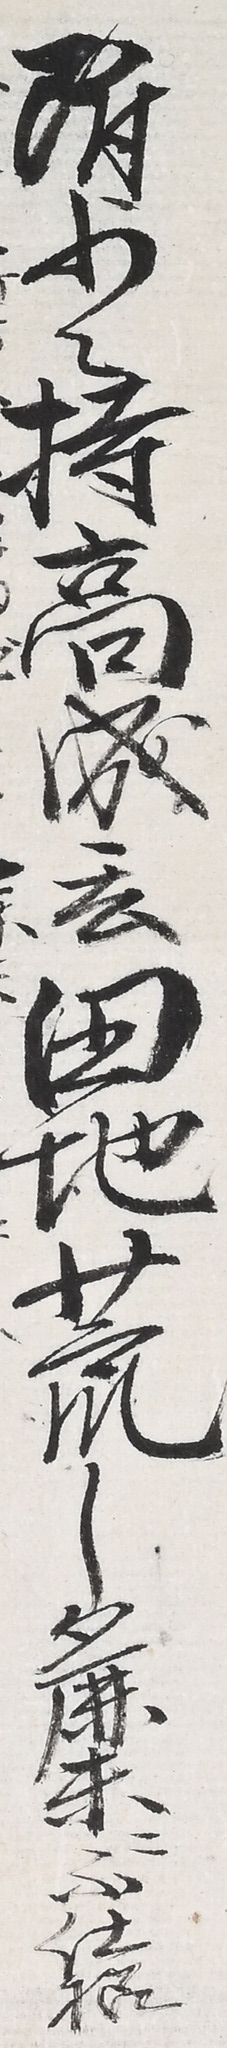附少々持高成共田地荒し粗麁末ニ不仕様
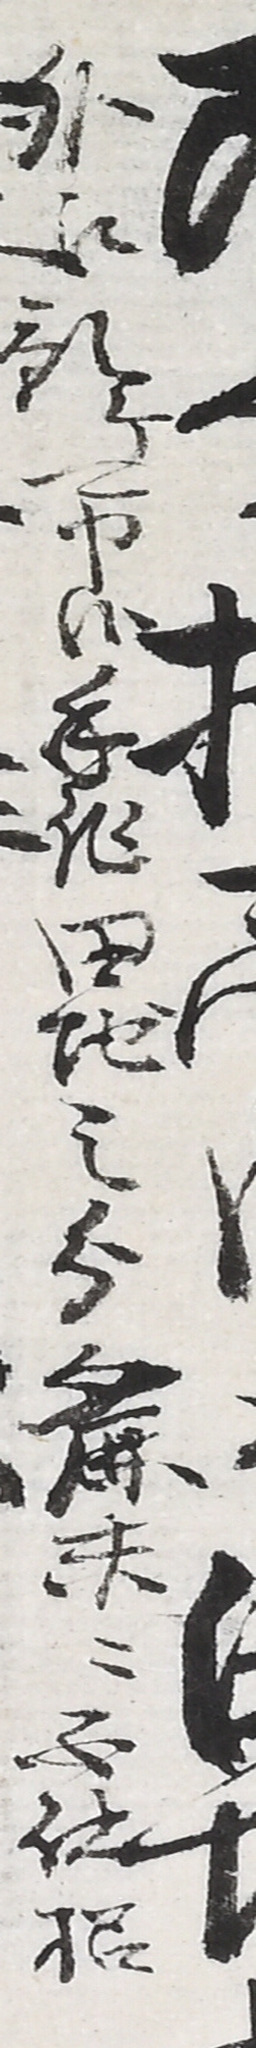外江預ヶ可申候手作田地之分粗麁末ニ不仕様
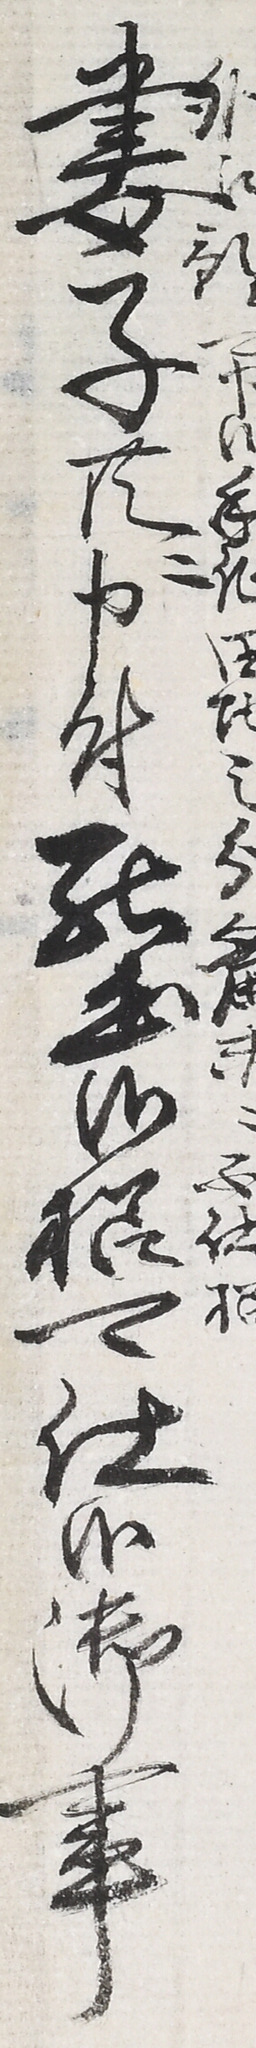妻子共ニ申付罷出候様可仕候御事
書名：弘化三丙午年正月他國出石切名前書上帳
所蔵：伊那市立高遠町図書館・合同会社AMANE
